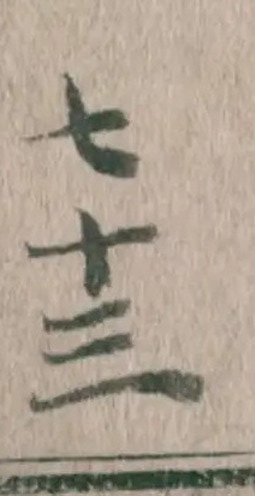七十三
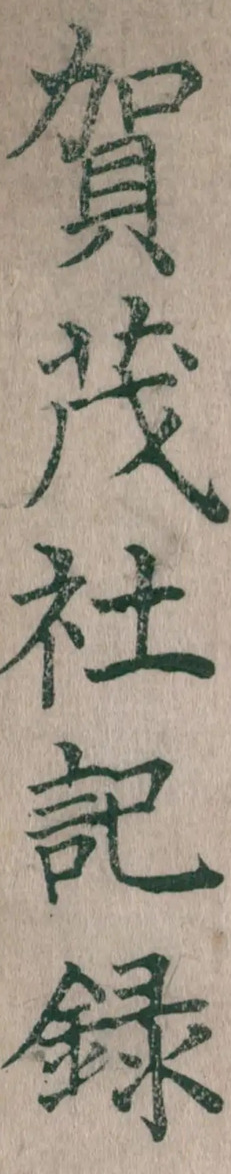賀茂杜記録

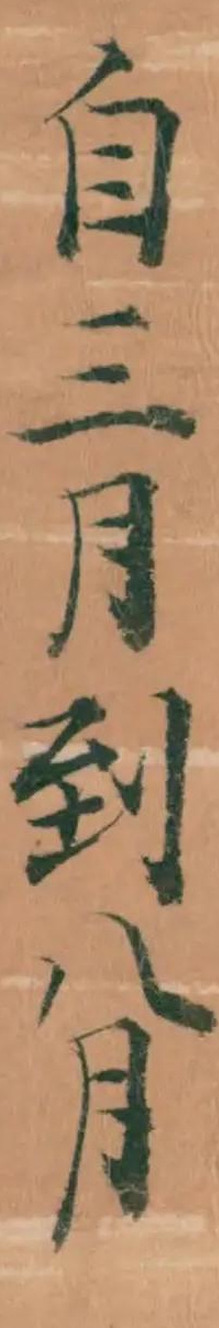自三月到八月
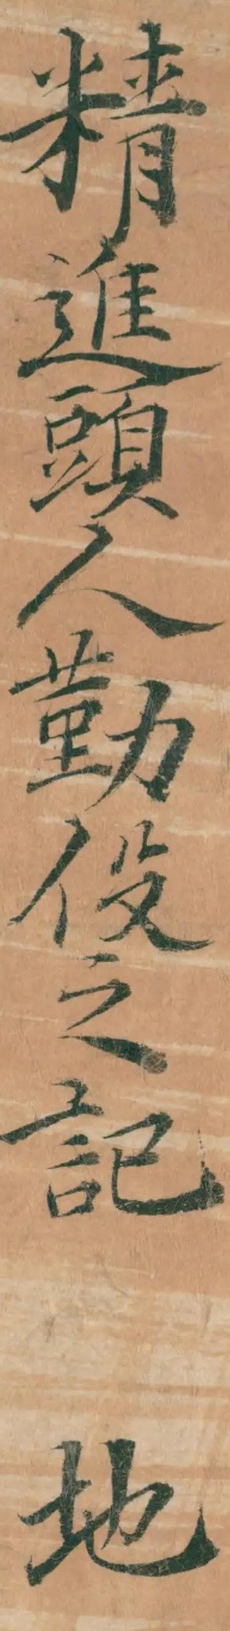精進頭人勤役之記地

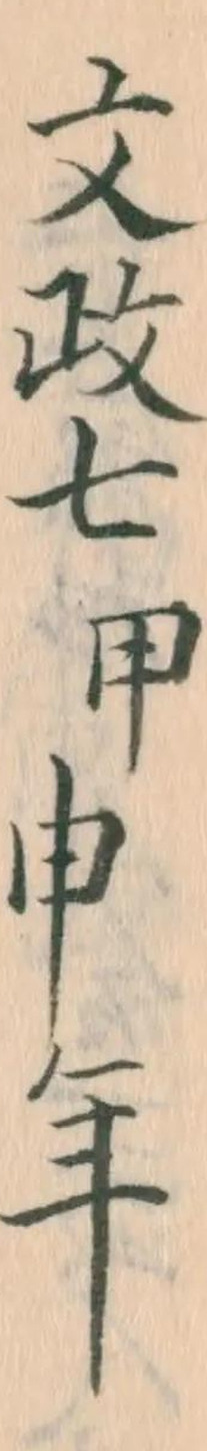文政七甲申年
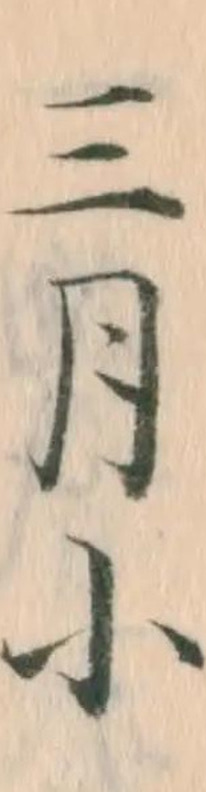三月小
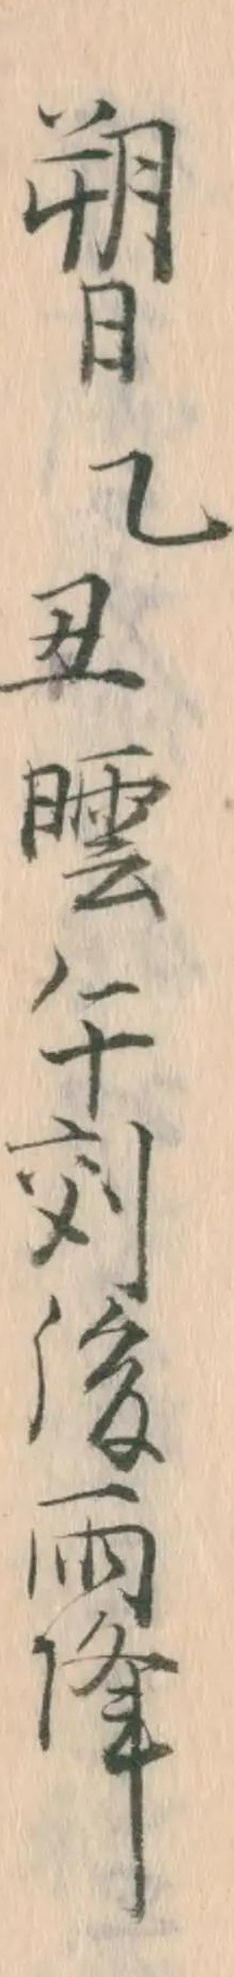朔日乙丑曇午刻後雨降
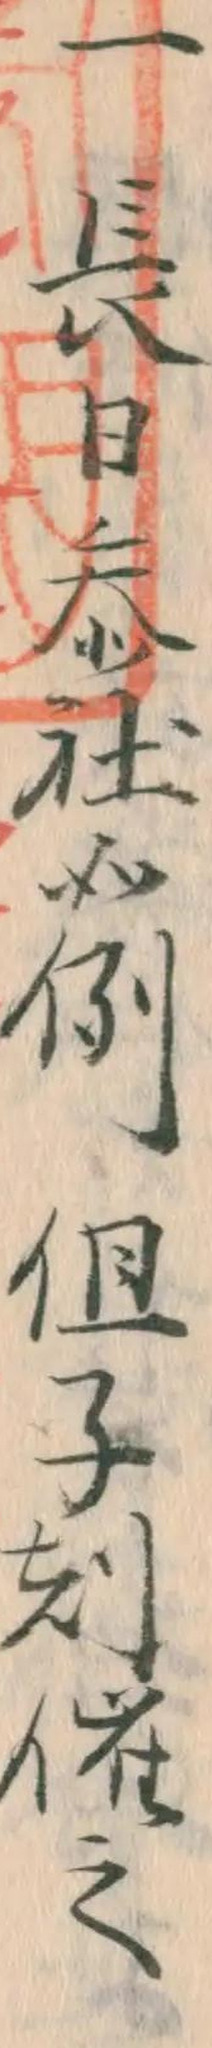一長日参社如例但子刻催之
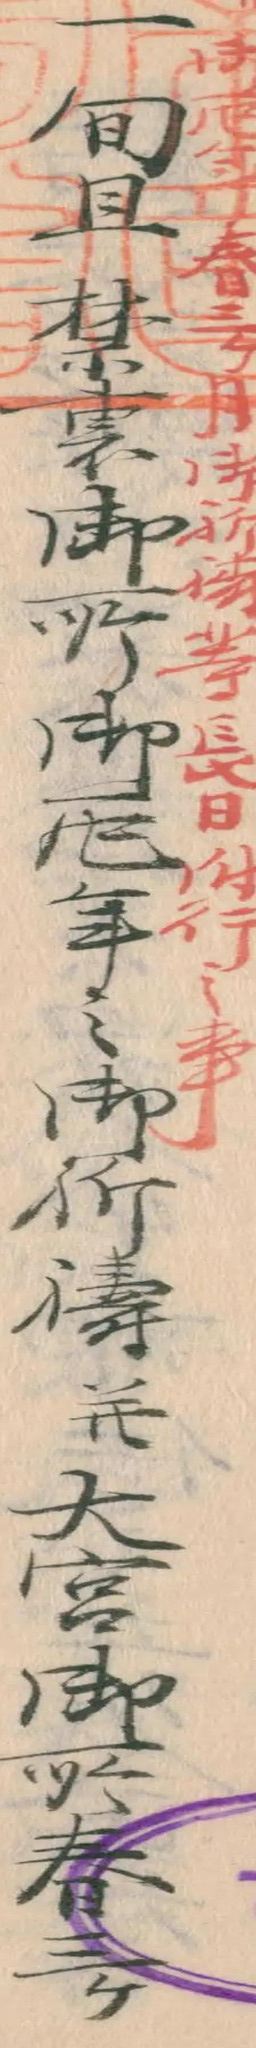一旬且禁裏御所御厄年之御祈祷并大宮御所春三ヶ
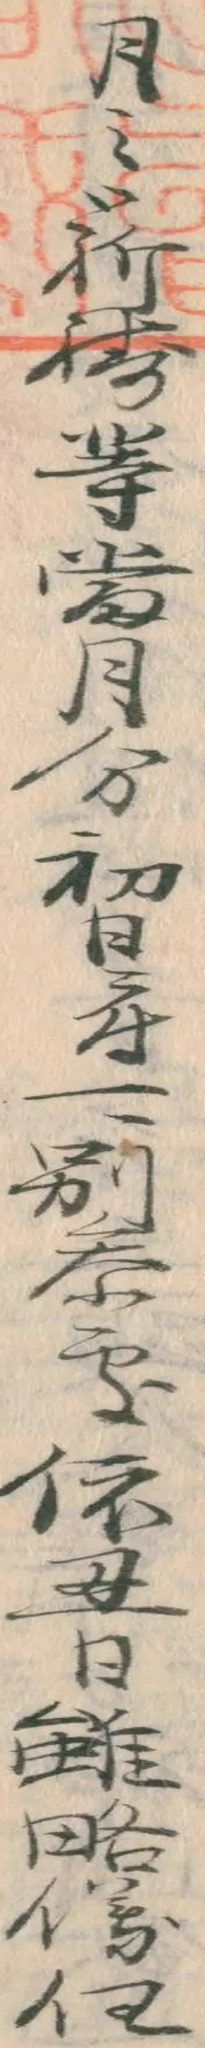月之御祈祷等當月分初日ニ付可別参處依丑日雖略儀任
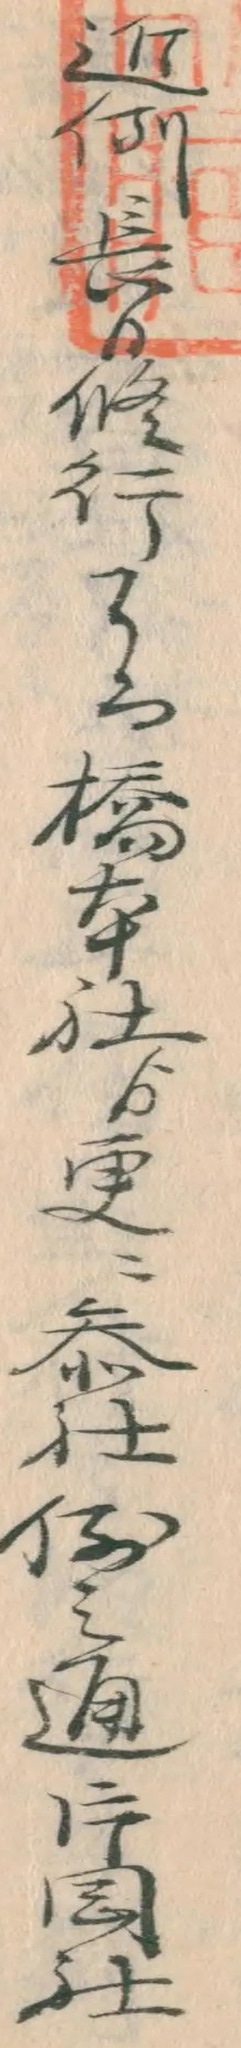近例長日修行了而橋本社ゟ更ニ参社例之通片岡社
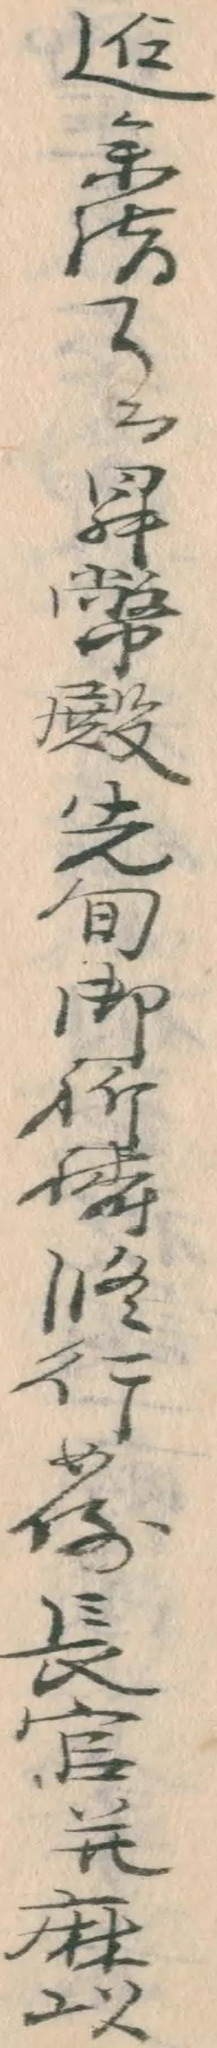迄参詣了而昇幣殿先旬御祈祷修行如例長官并麻以
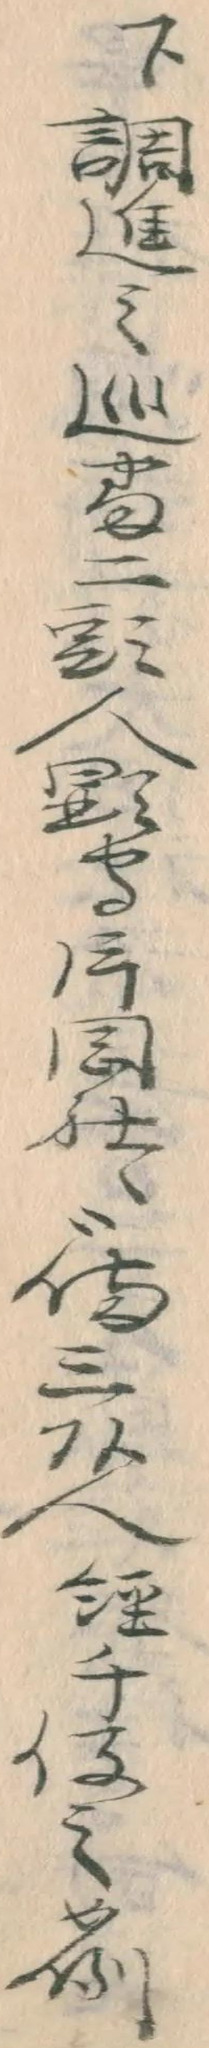下調進之巡番二頭人顕守片岡社へ御備三頭人経千役之如例
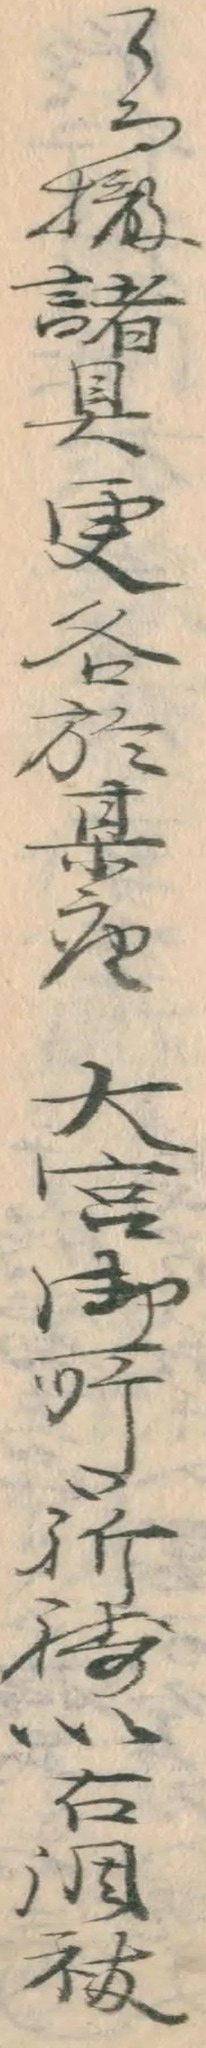了而撤諸具更各於某座大宮御所御祈祷以古調祓

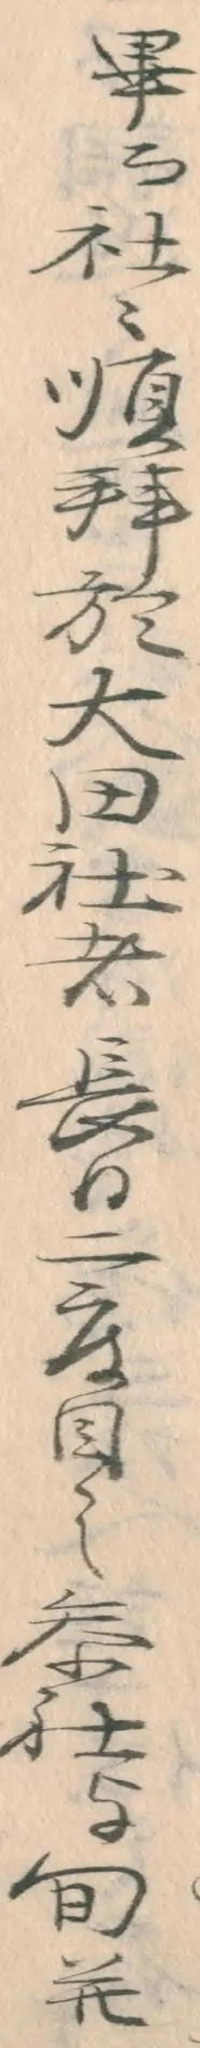畢而社々順拝於大田社者長日二度目之参社と旬并
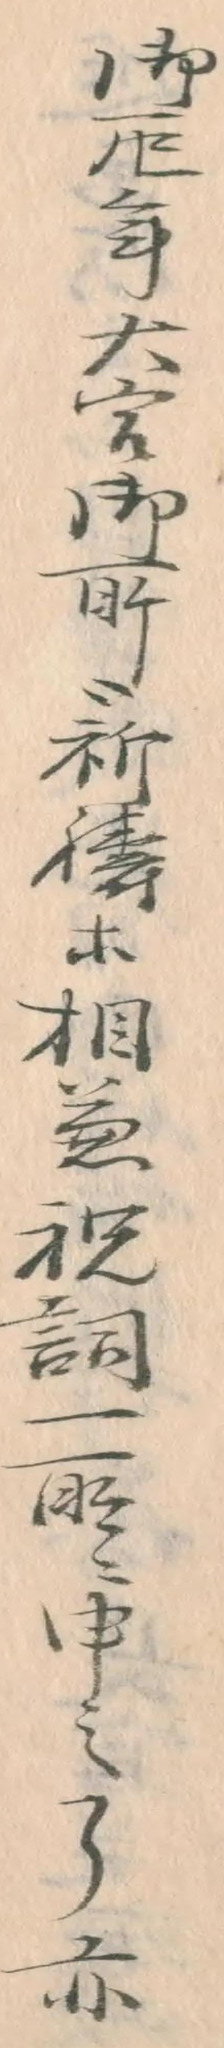御厄年大宮御所御祈祷等相兼祝詞一所ニ申之了亦
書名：賀茂社記録. 第73冊
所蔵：国立国会図書館 National Diet Library, JAPAN
